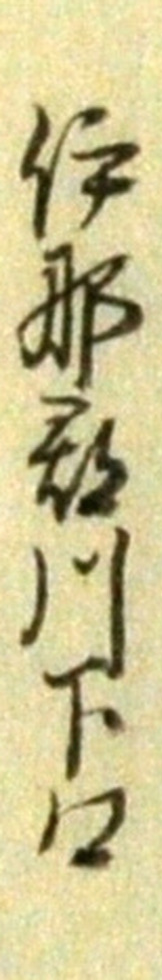伊那郡川下郷
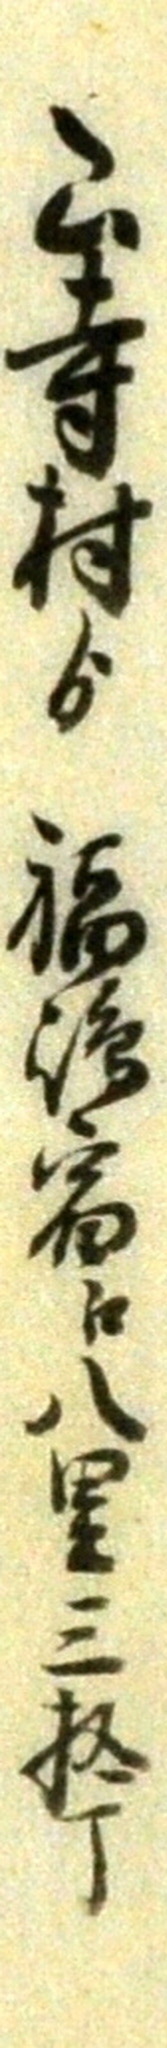山寺村ゟ福嶋宿江八里三拾丁
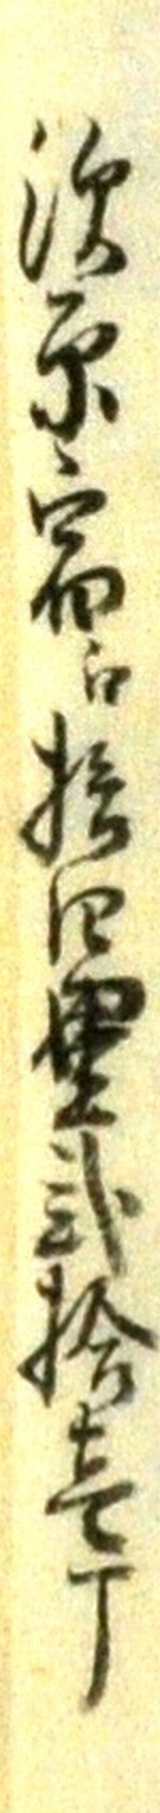同村ゟ須原宿江拾四里弐拾壱丁
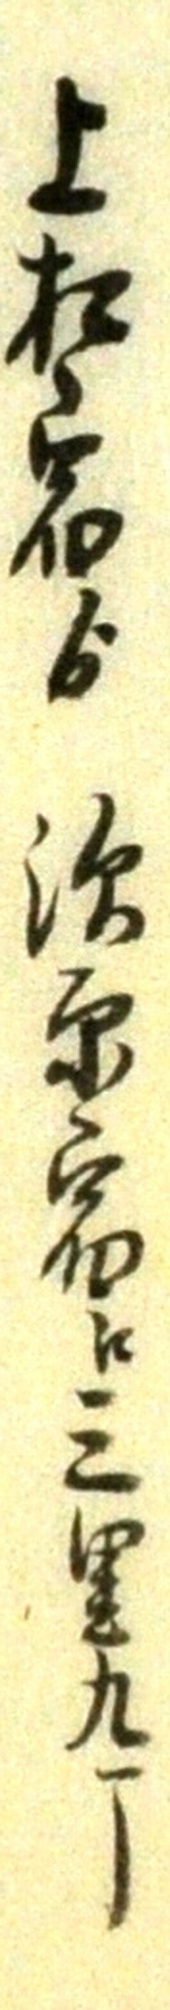上松宿ゟ須原宿江三里九丁
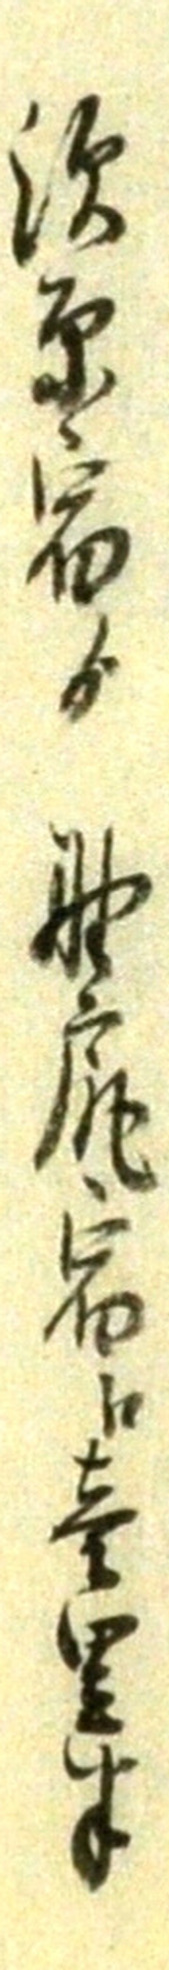須原宿ゟ野尻宿江壱里半
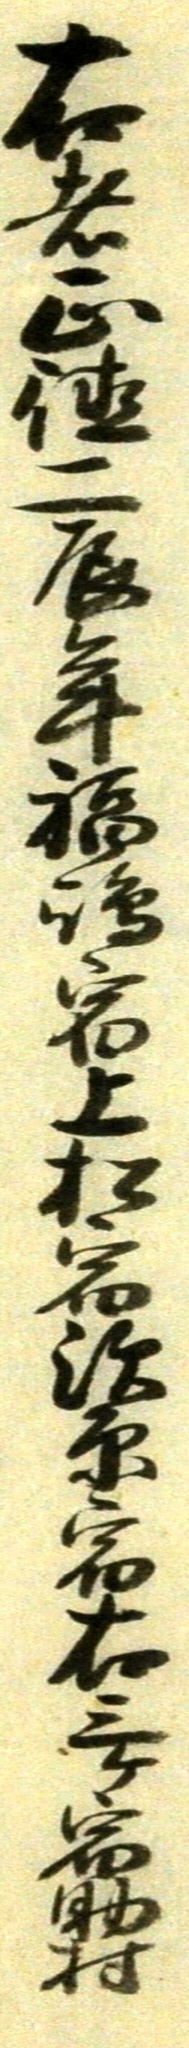右者正徳二辰年福嶋宿上松宿須原宿右三ヶ宿助村
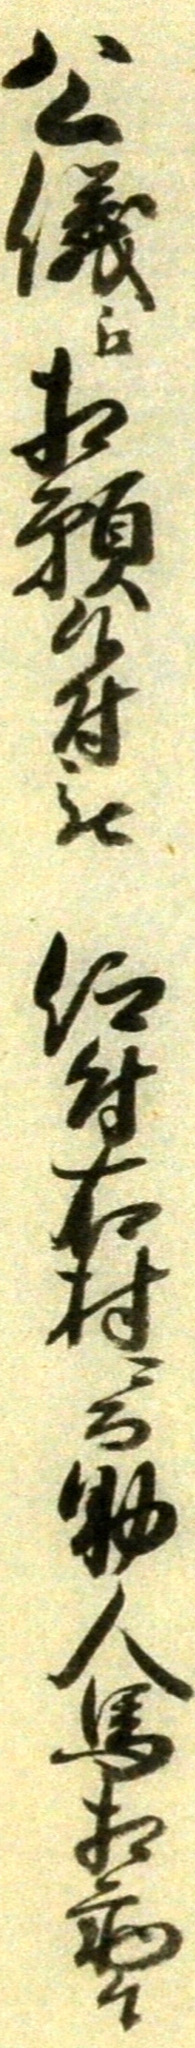公儀江相願候付被仰付右村ニ而助人馬相勤候
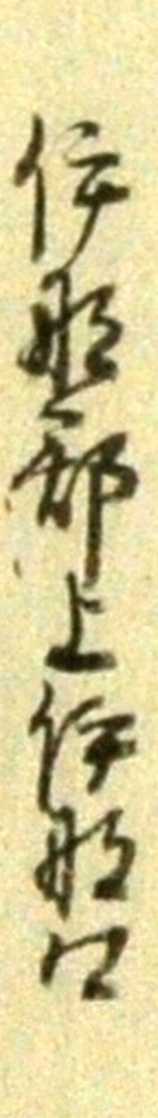伊那郡上伊那郷
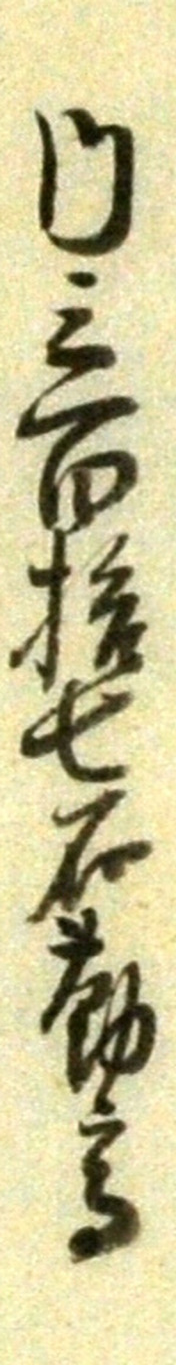内三百拾七石勤高
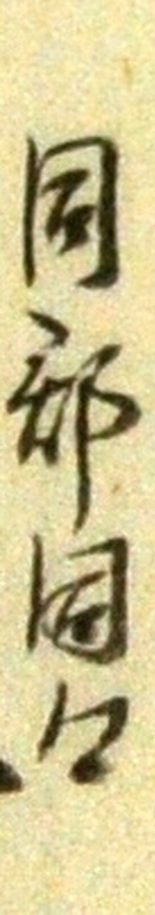同郡同郷
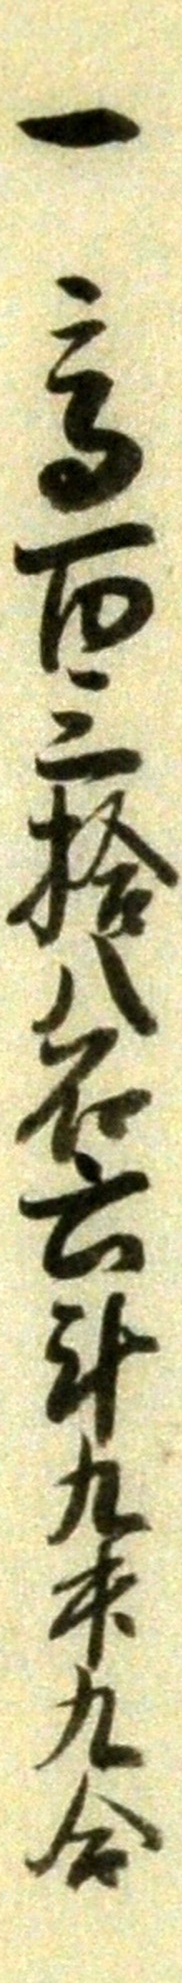一高百三拾八石六斗九升九合今村

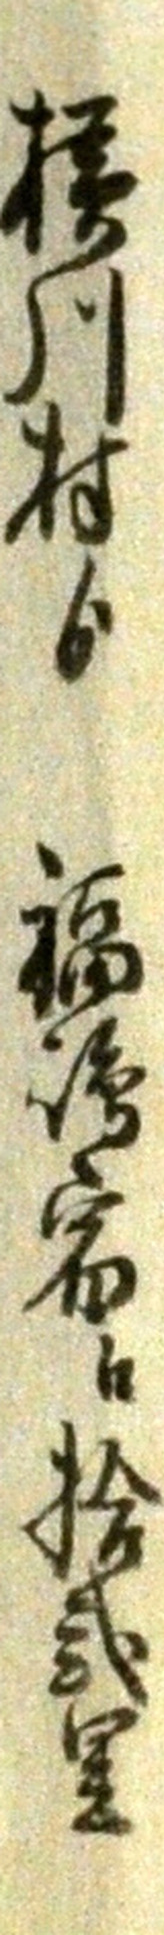横川村ゟ福嶋宿江拾弐里
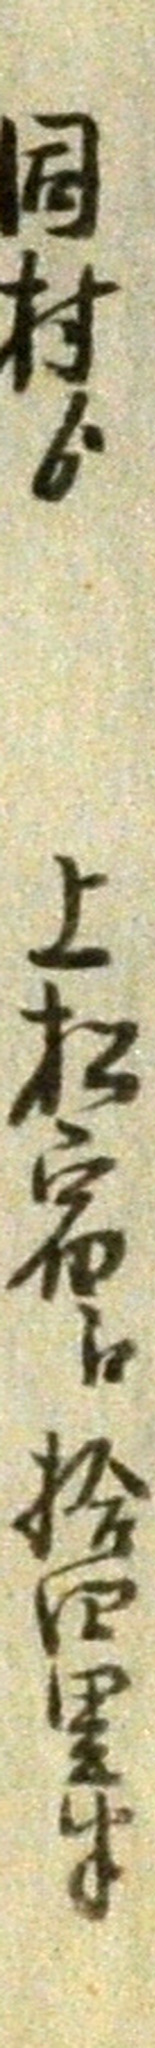同村ゟ上松宿江拾四里半
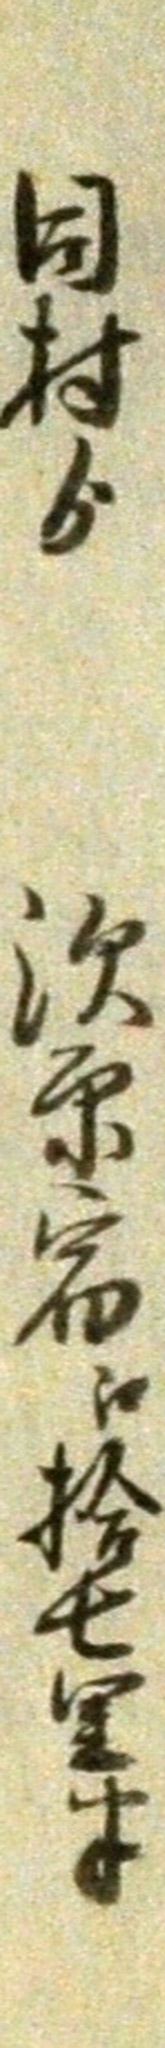同村ゟ須原宿江拾七里半
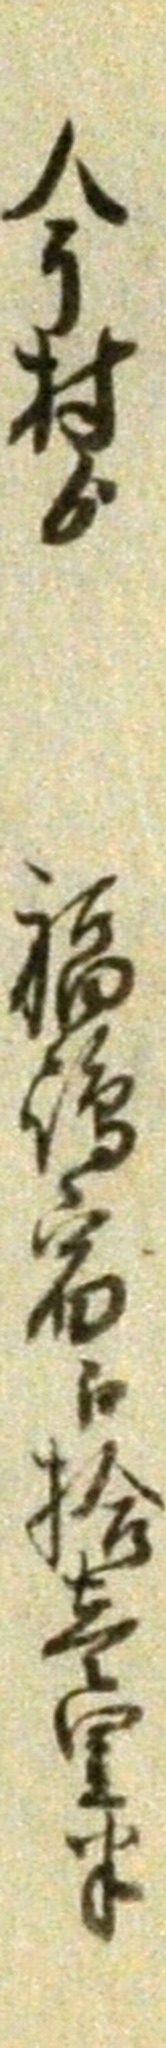今村ゟ福嶋宿江拾壱里半
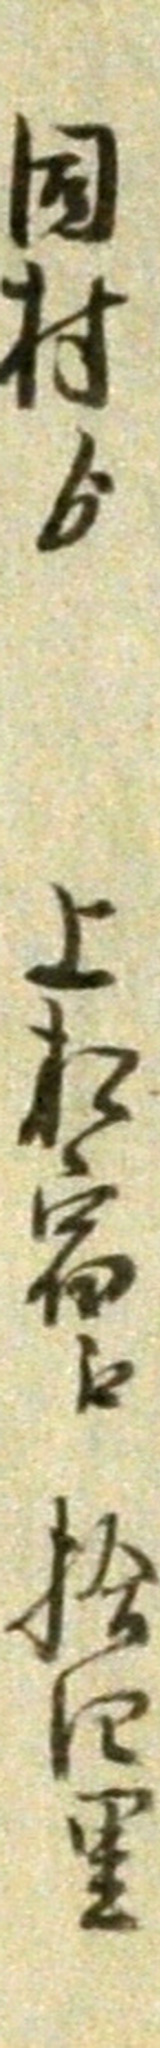同村ゟ上松宿江拾四里
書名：御領分拾九箇村木曽助并塩尻町・洗馬町・本山町へ人馬勤覚帳
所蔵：伊那市立高遠町図書館・合同会社AMANE
